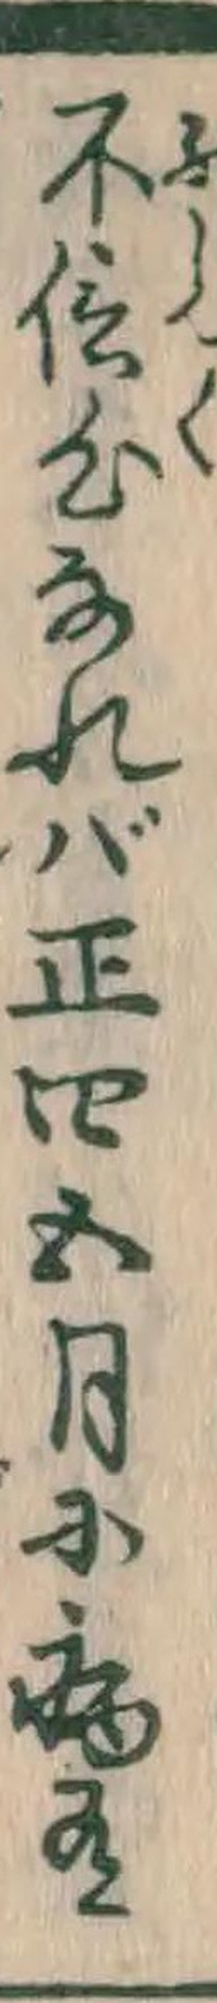不信心なれば正四五月に病有
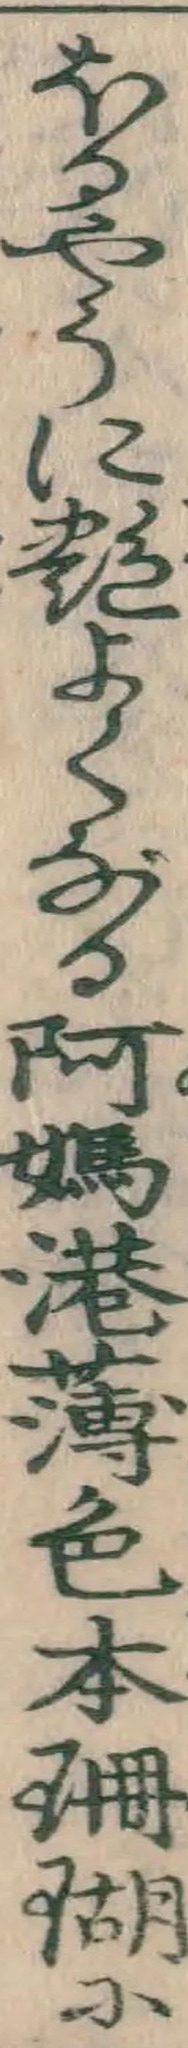ほるやうに艶よくなる阿媽港薄色本珊瑚に
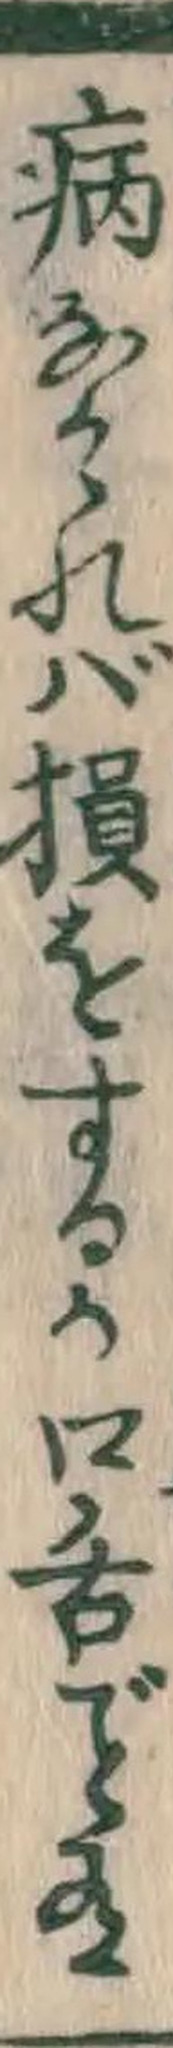病なければ損をするか口舌ごと有
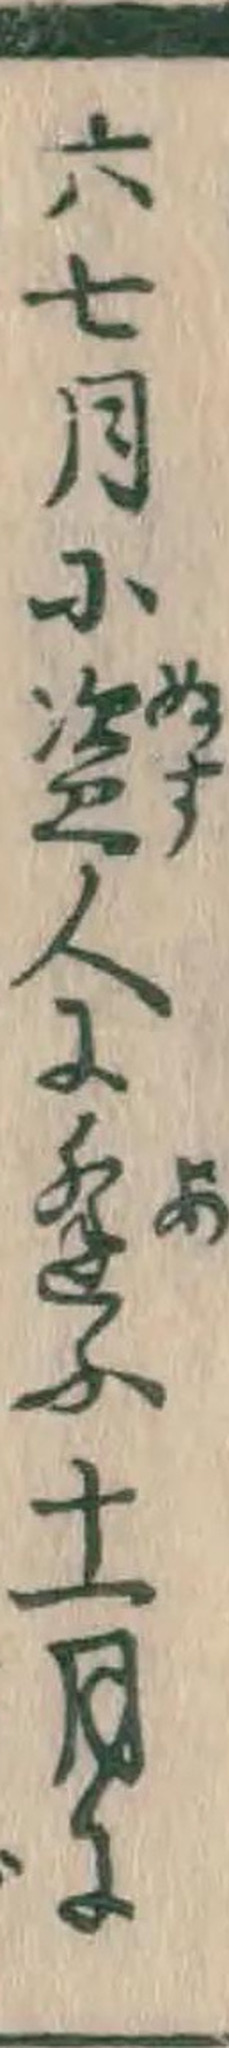六七月に盗人に逢ふ十一月に
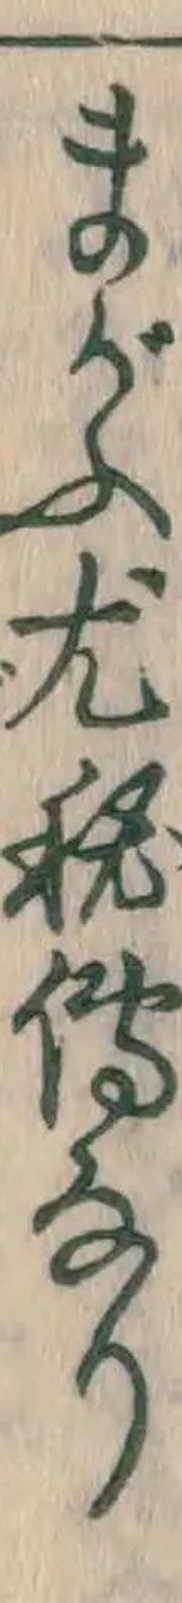まがふ尤秘伝なり
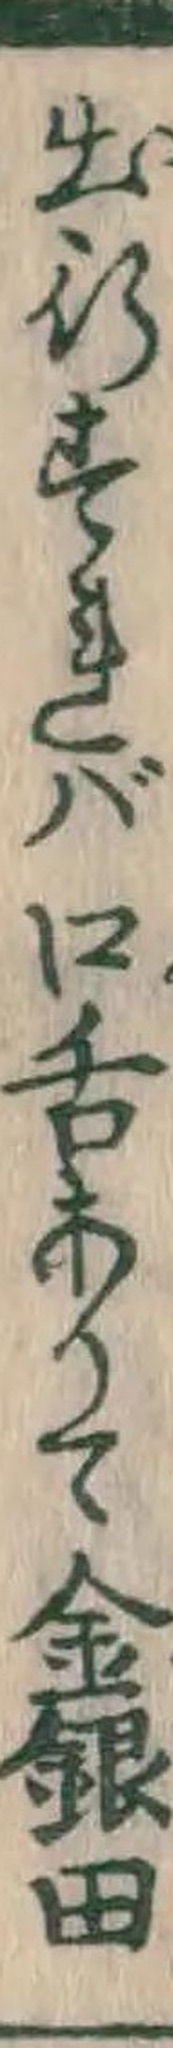出行すれば口舌ありて金銀田
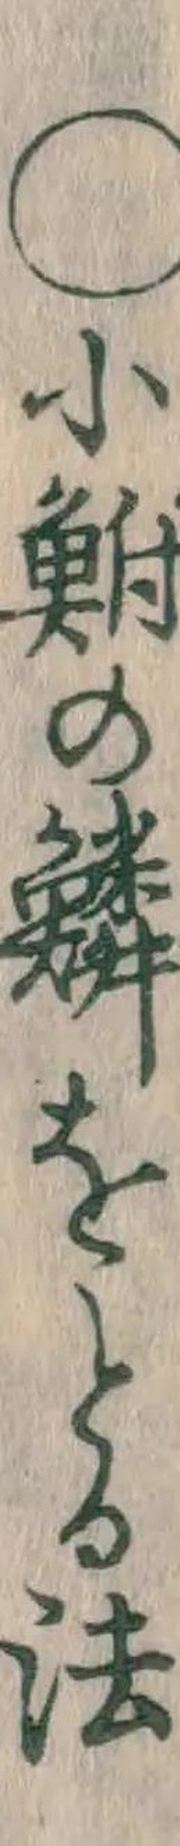○小鮒の鱗をとる法
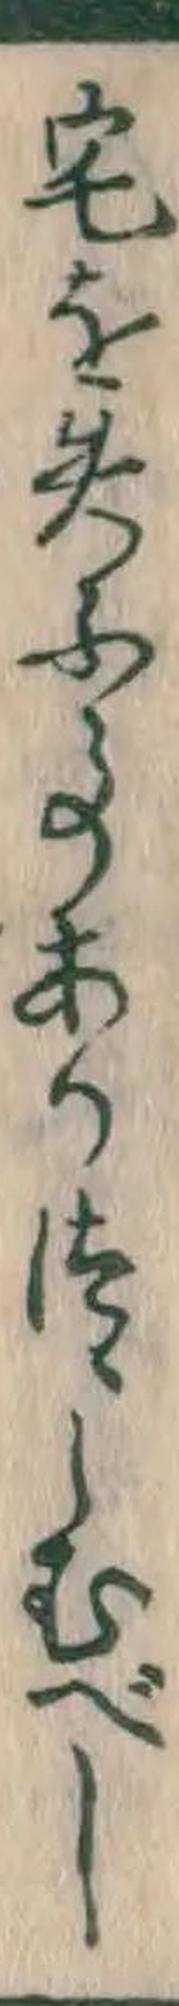宅を失ふ事ありつゝしむべし
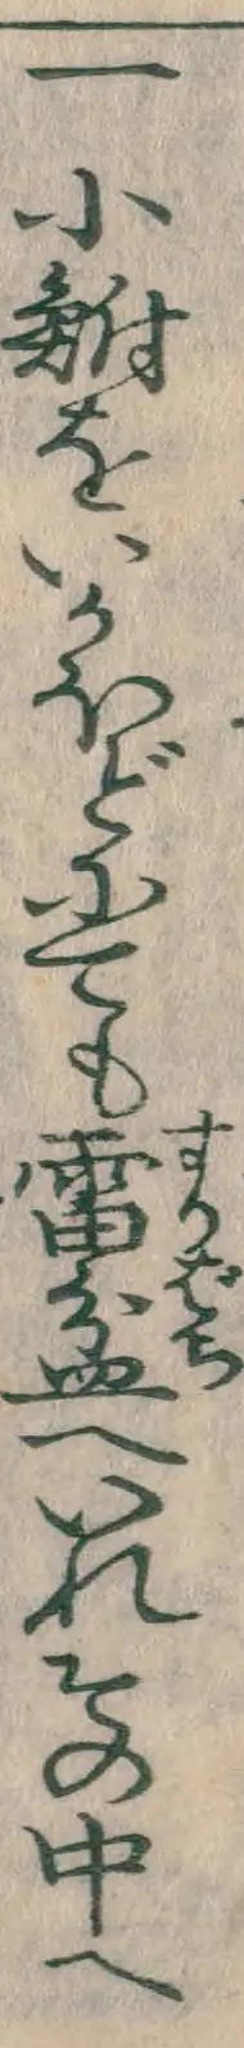一小鮒をいかほでにても雷盆へいれその中へ
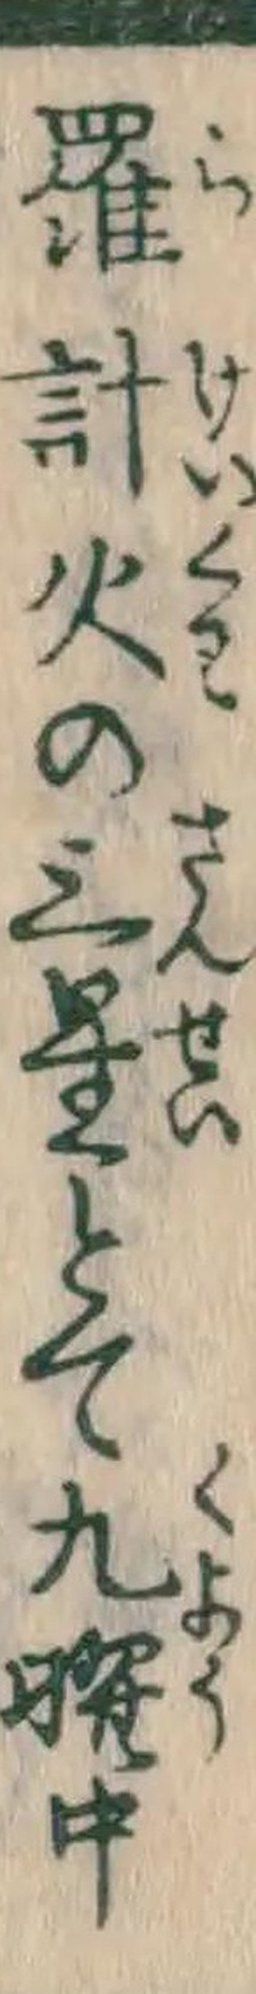羅計火の三星とて九曜中
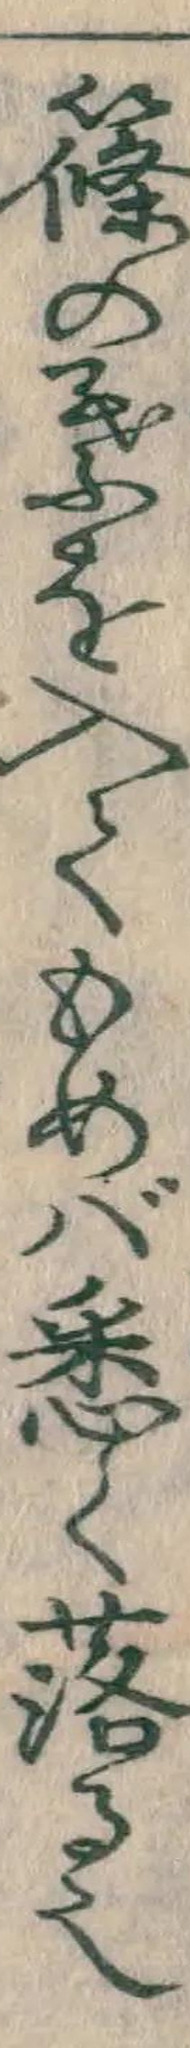篠の葉を入てもめば悉く落る也
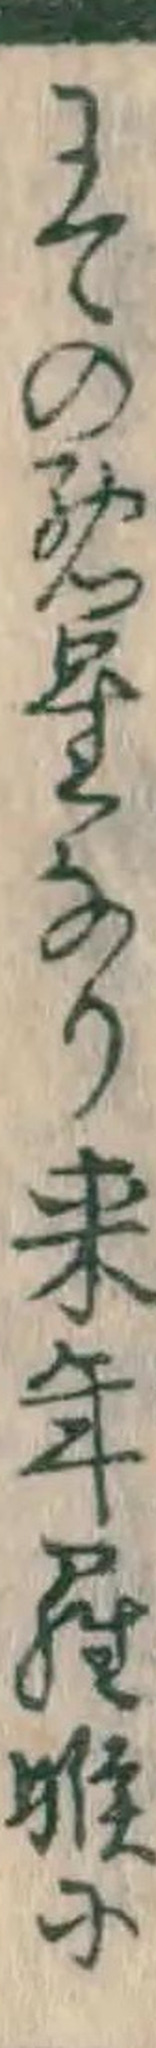にての悪星なり来年羅睺に
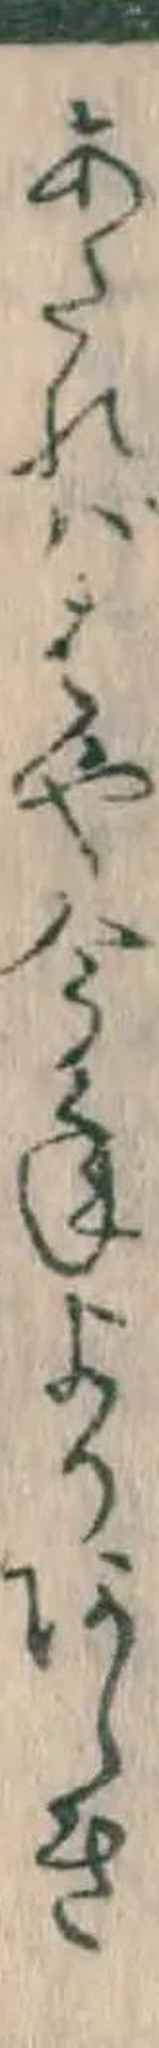あたればはや今年よりあしき
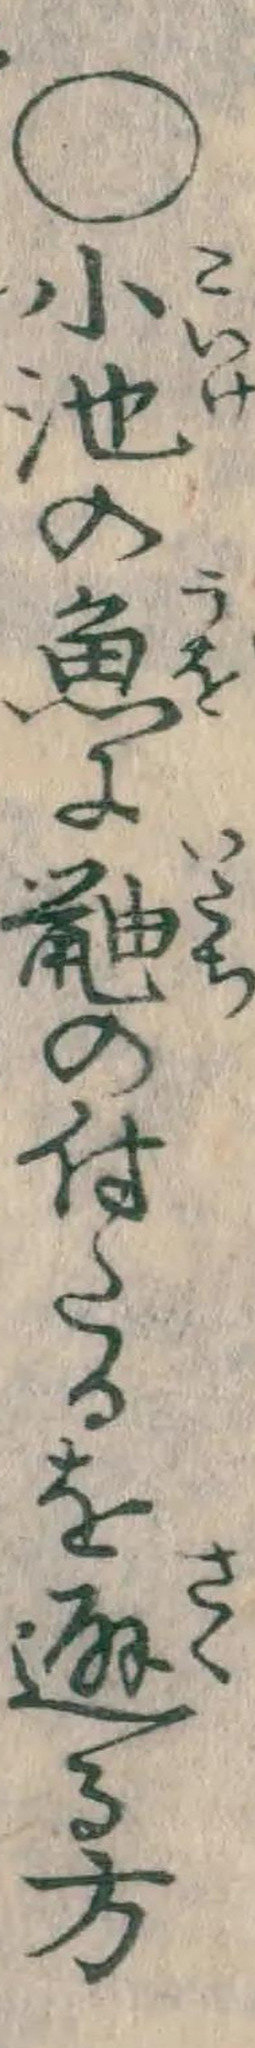○小池の魚に鼬の付たるを避る方
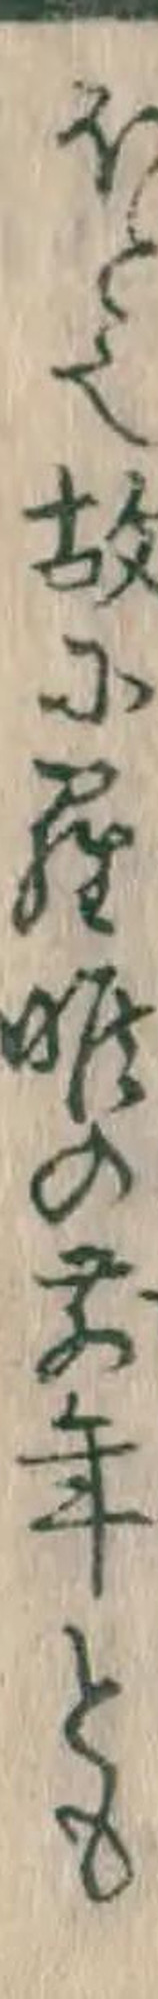ほど也故に羅睺の前年とも
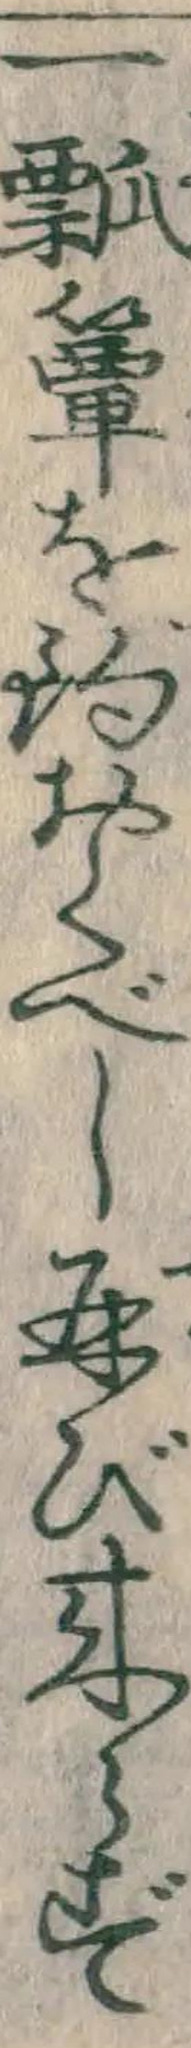一瓢簞を釣おくべし再び来らず
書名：広益秘事大全 3巻. [1]
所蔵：国立国会図書館 National Diet Library, JAPAN
